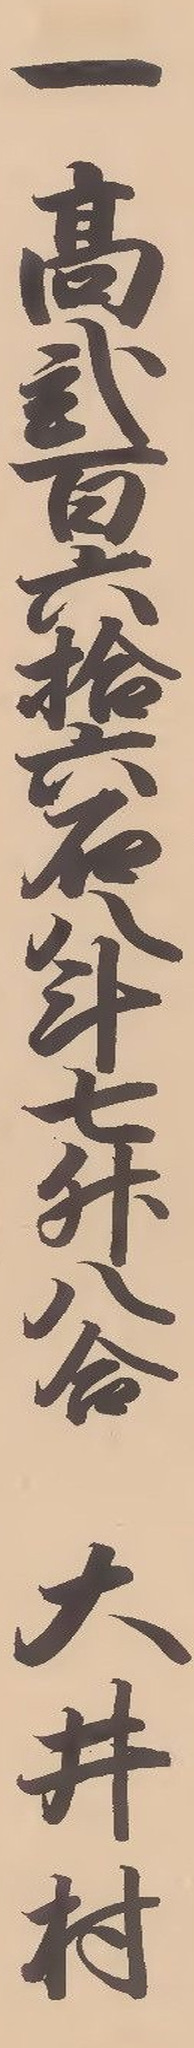一高弐百六拾六石八斗七升八合大井村

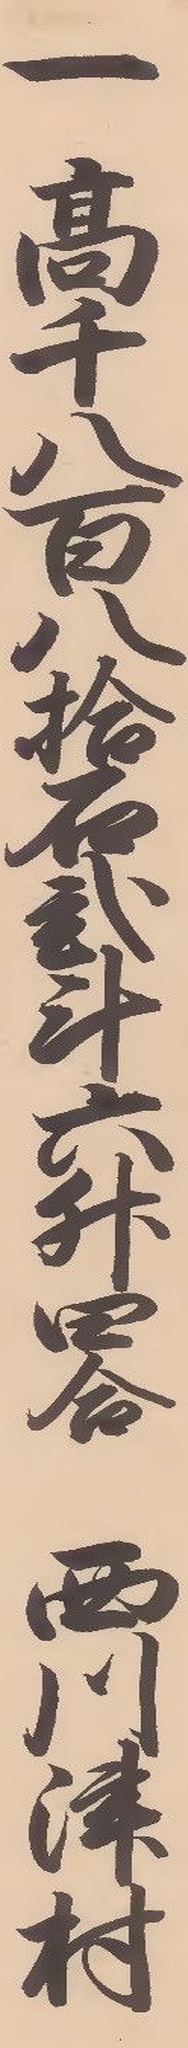一高千八百八拾石弐斗六升四合西川津村

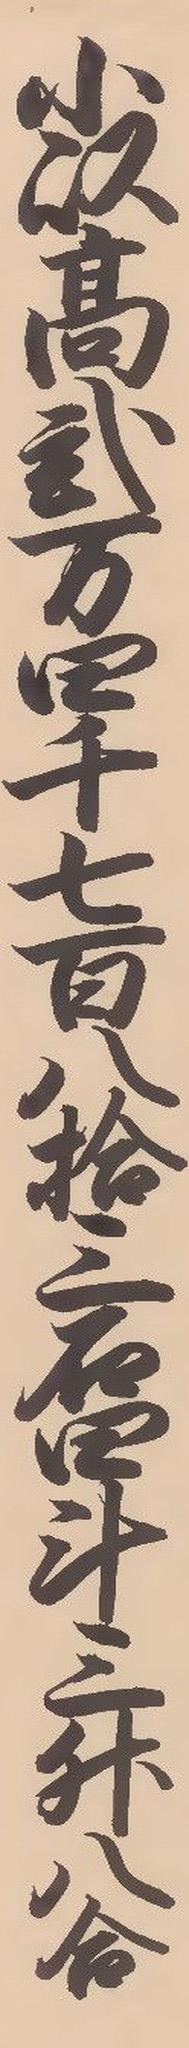小以高弐万四千七百八拾三石四斗三升八合

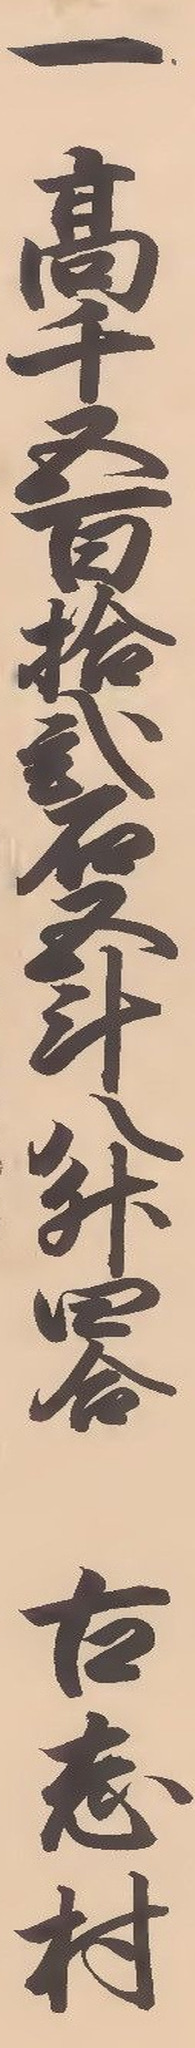一高千五百拾弐石五斗八升四合古志村

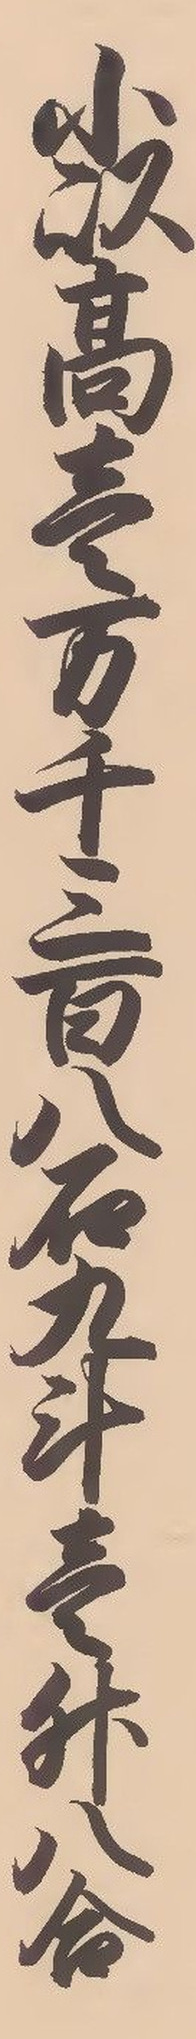小以高壱万千三百八石九斗壱升八合
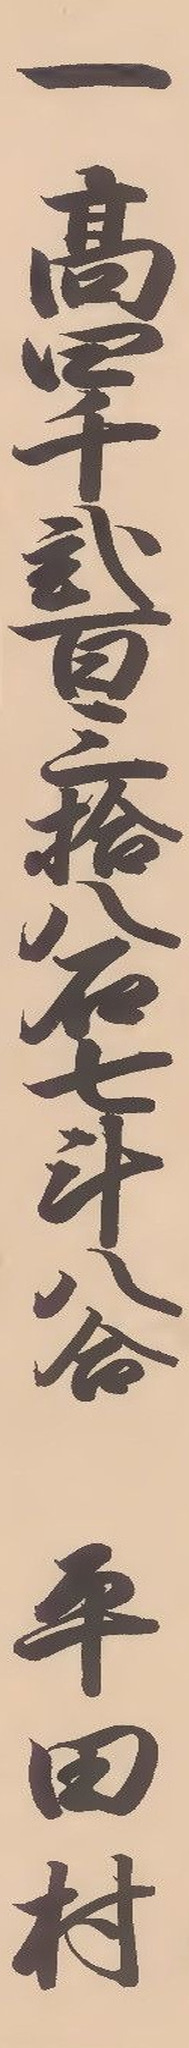一高四千弐百三拾八石七斗八合平田村

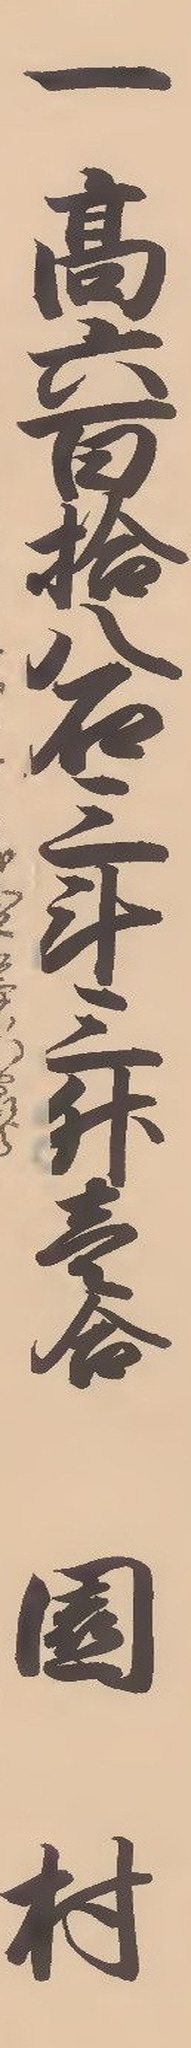一高六百拾八石三斗三升壱合園村
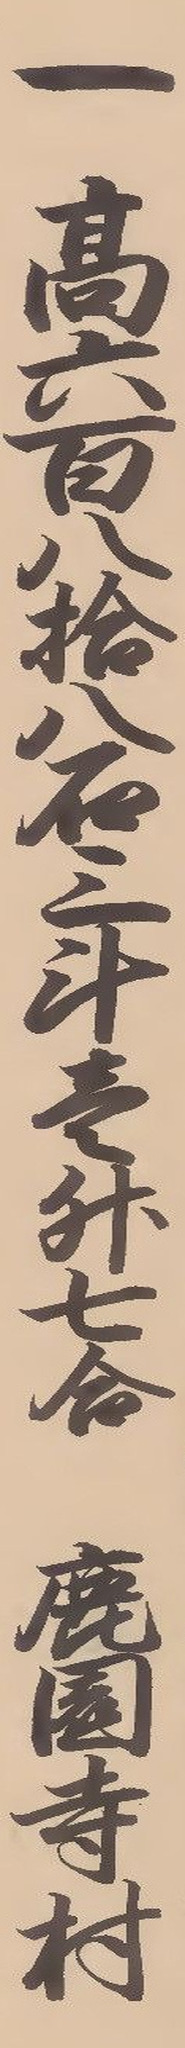一高六百拾八石三斗三升壱合園村

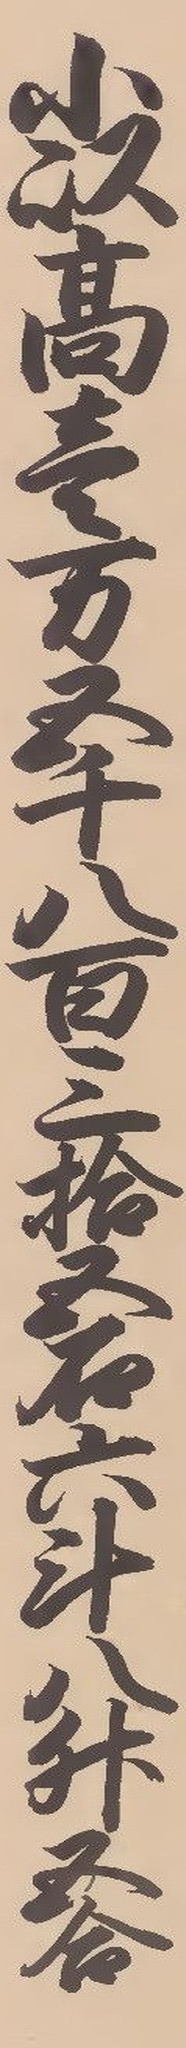小以高壱万五千八百三拾五石六斗八升五合

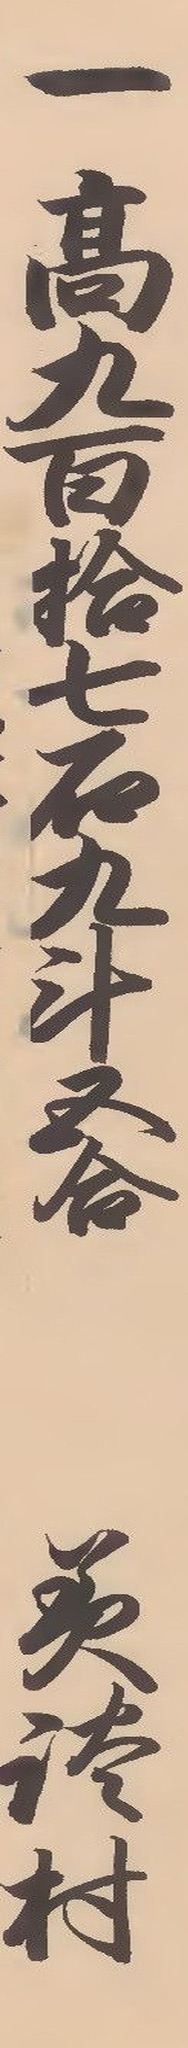一高九百拾七石九斗五合美談村
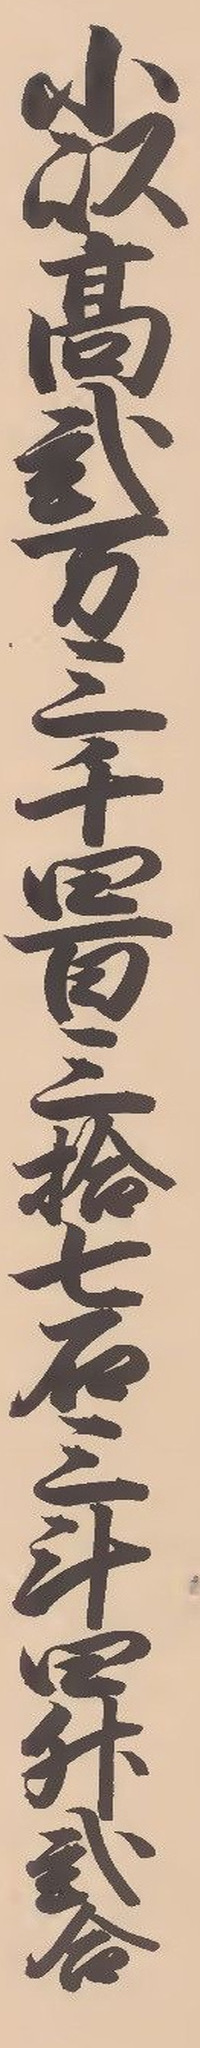小以高弐万三千四百三拾七石三斗四升弐合

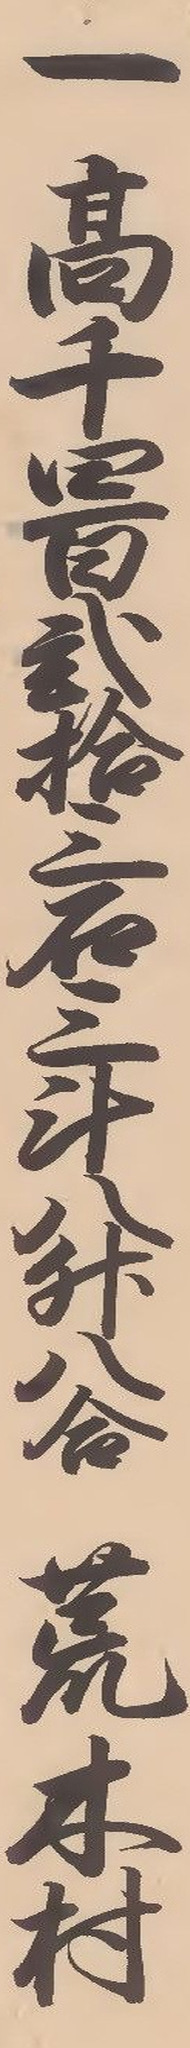一高千四百弐拾三石三斗八升八合荒木村

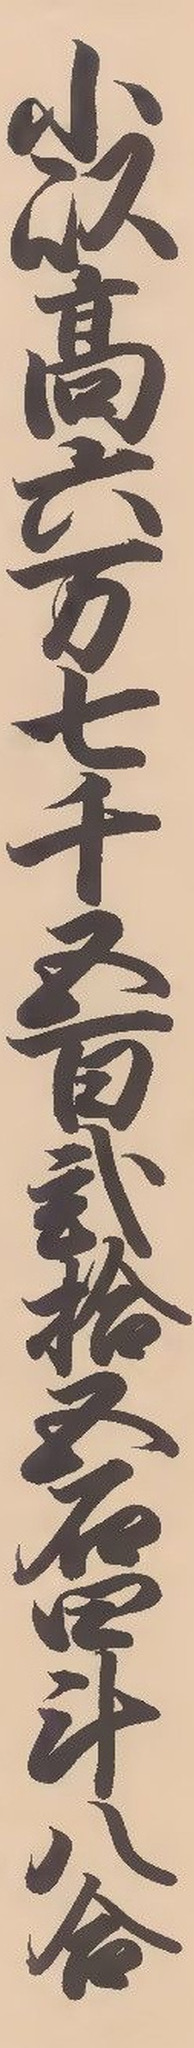小以高六万七千五百弐拾五石四斗八合

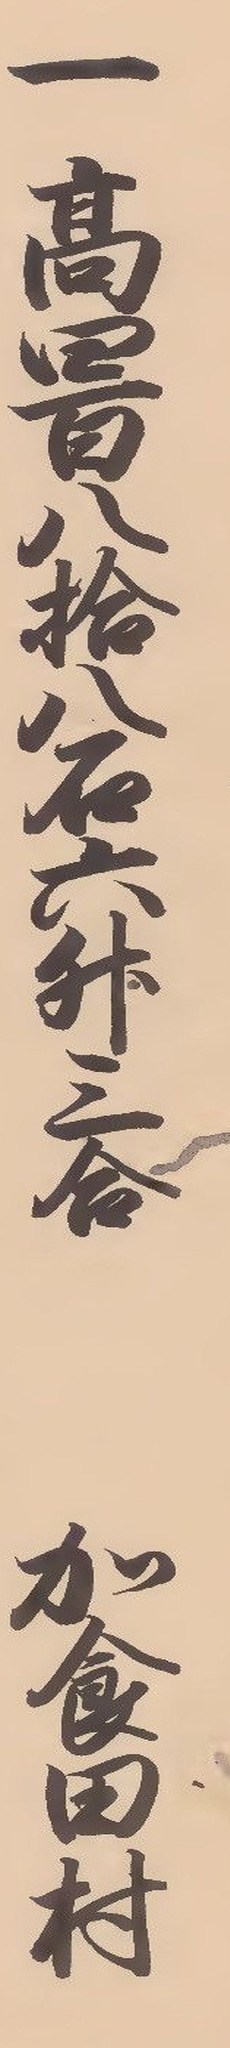一高四百八拾八石六升三合加食田村

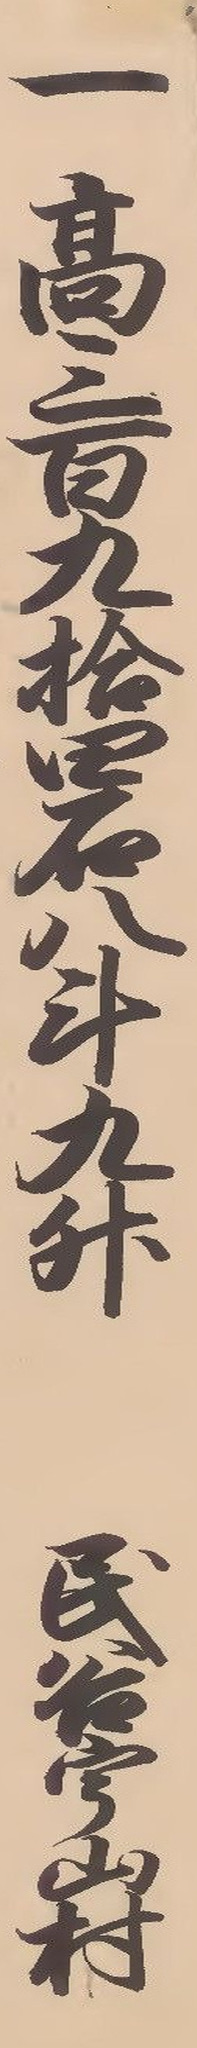一高三百九拾四石八斗九升民谷宇山村

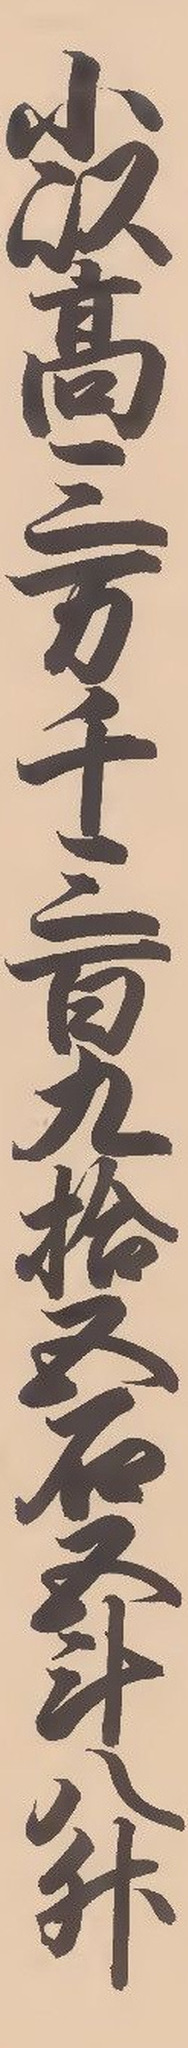小以高三万千三百九拾五石五斗八升
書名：出雲国郷帳
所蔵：国立公文書館 National Archives of Japan
